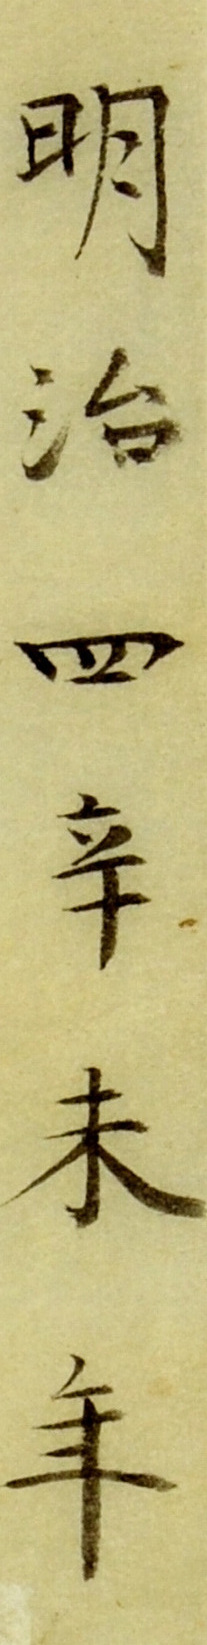明治四辛未年
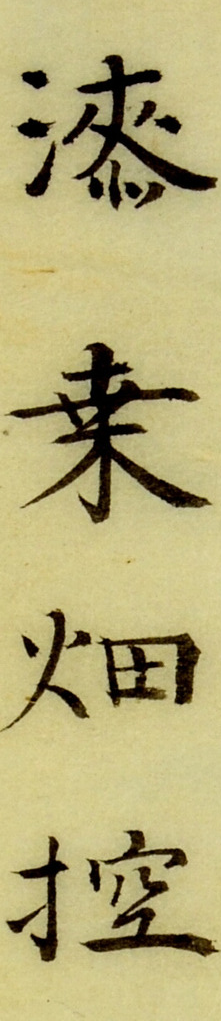漆桑畑控
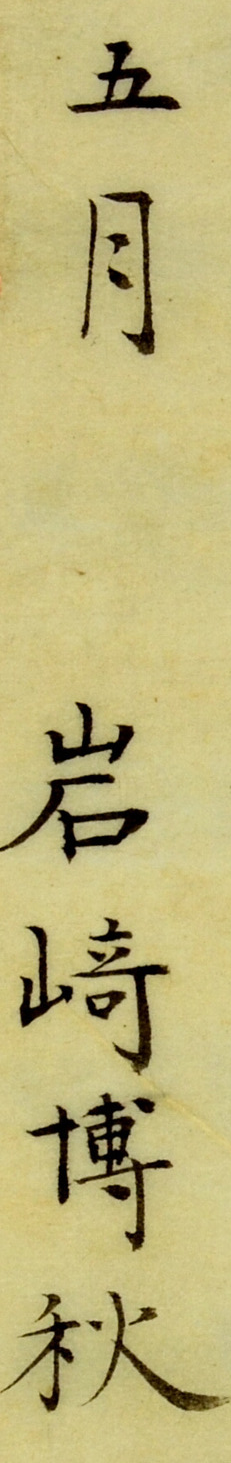五月岩崎博秋

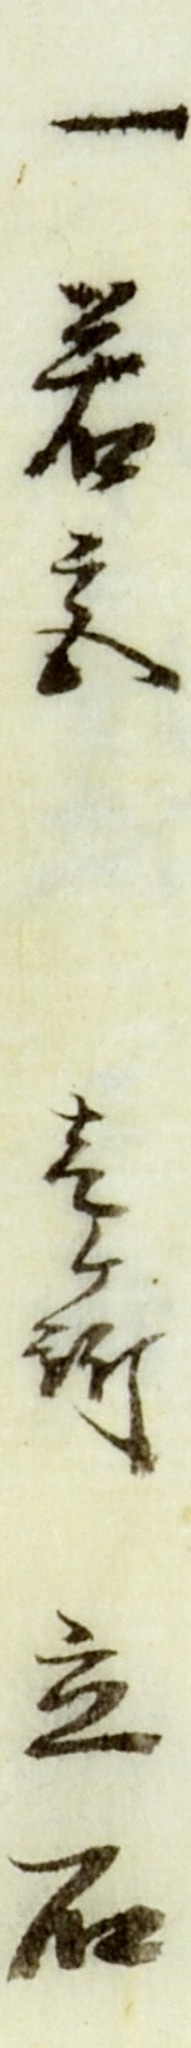一若宮壱ヶ所立石
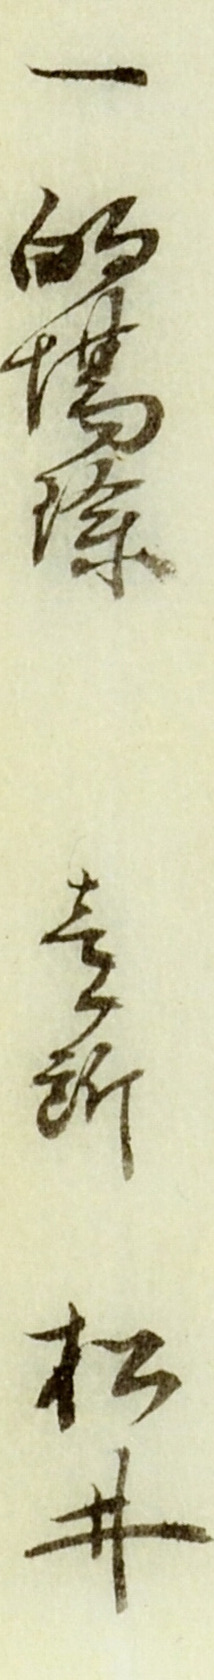一的場除壱ヶ所松井

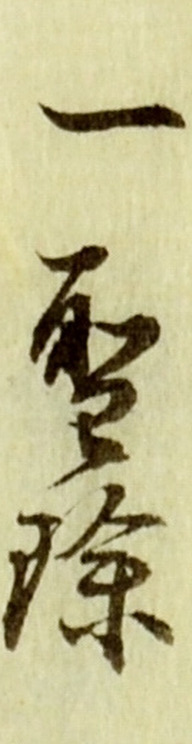一聖除
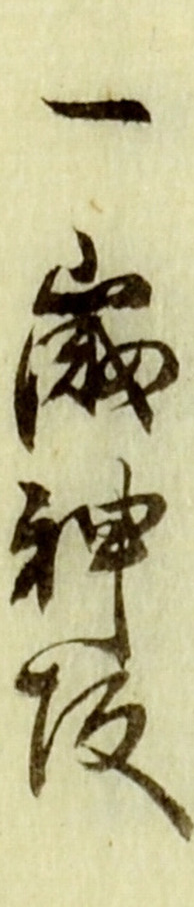一歳神坂
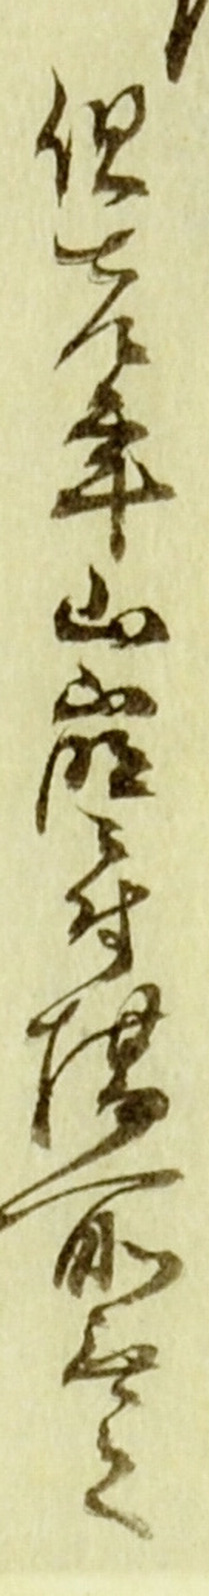但先年山崩ニ付場所無之
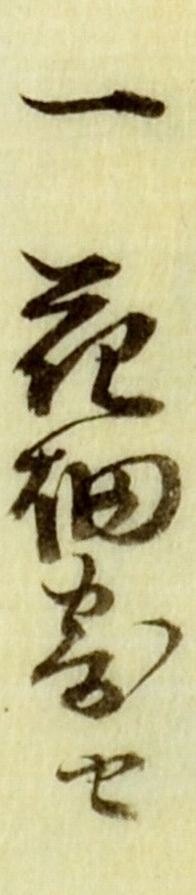一花畑寄セ
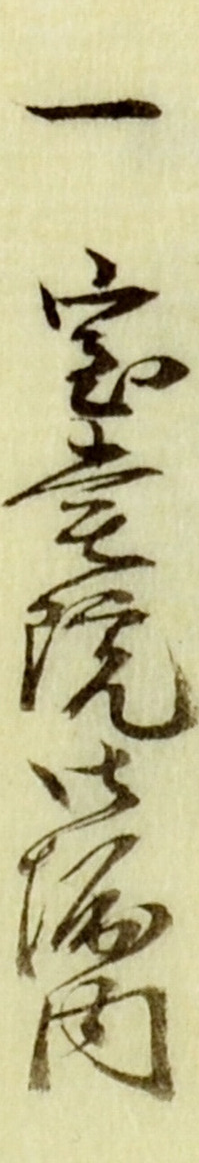一室堂院御堀内

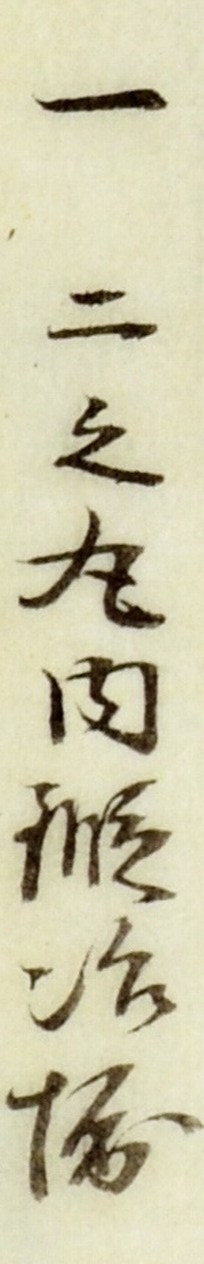一二之丸内鍛冶堀
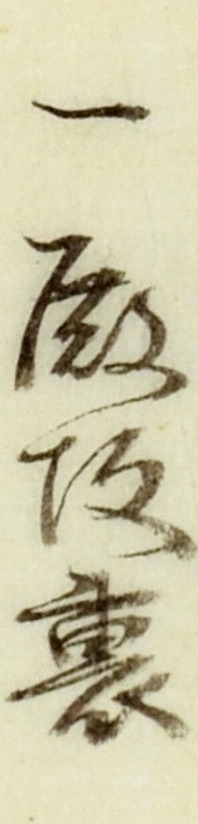一殿坂裏
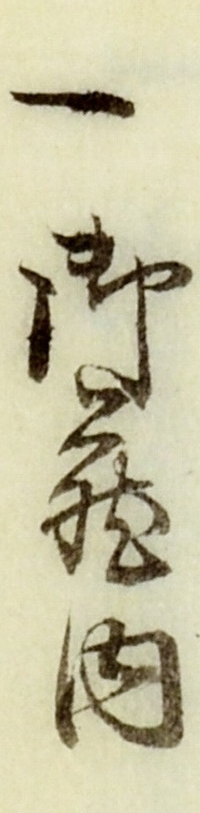一御蔵内
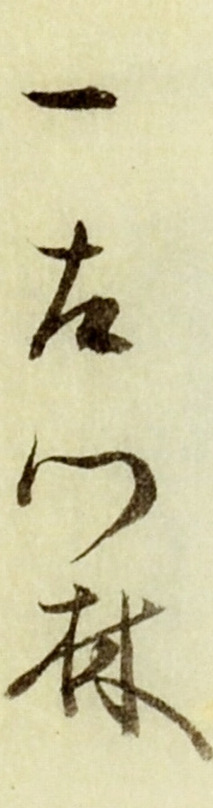一左門林
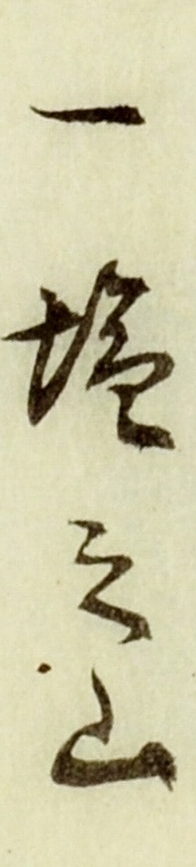一塩之山
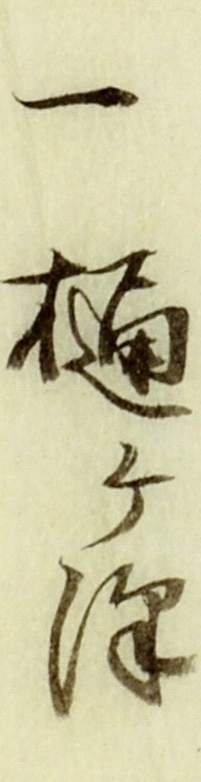一樋ヶ沢
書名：漆桑畑控
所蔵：伊那市立高遠町図書館・合同会社AMANE
